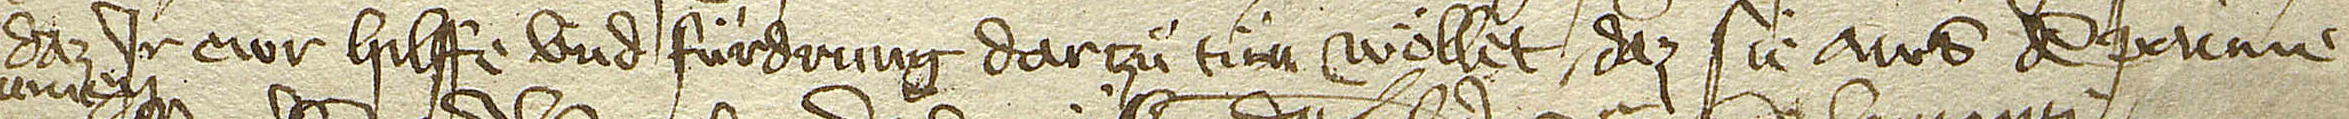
daʒ Ir ewr hilffe vnd fürdrung darcʒü tün wöllet / daʒ ſie aws d* panne
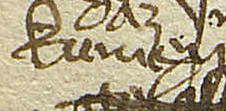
kumen
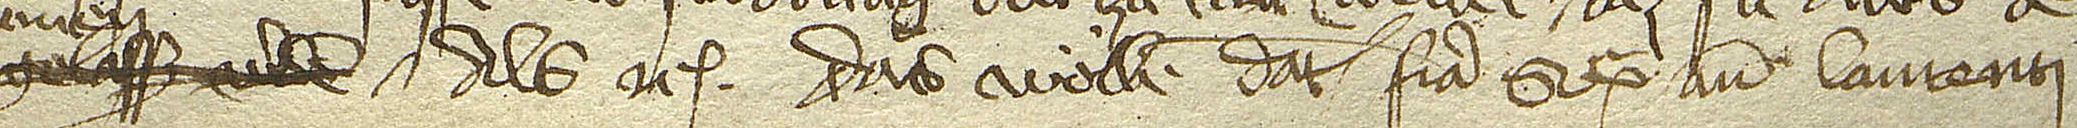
gelaſſ* w*de* / Als ec* . Das wölle* dat* fia* Sex* an* laurenci*
